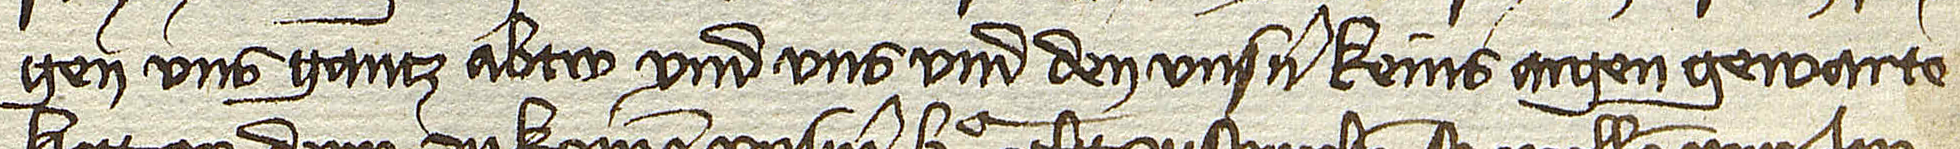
gen vns gancʒ abtw vnd vns vnd den vnſ*n keins argen gewarte
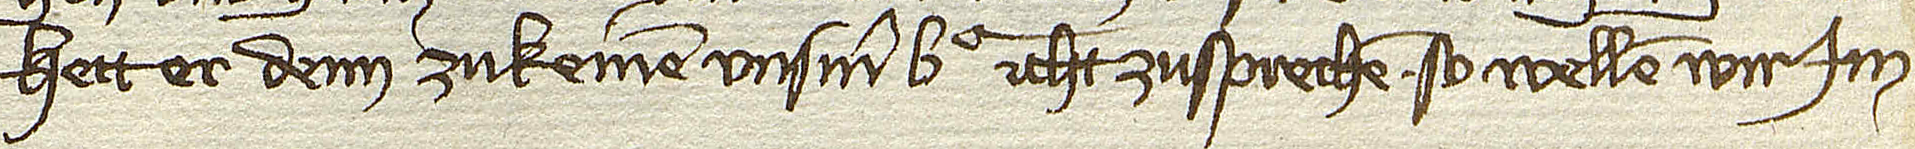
hett er denn ʒu keine* vnſ*m b* icht ʒuſpreche* . ſo welle* wir Im
